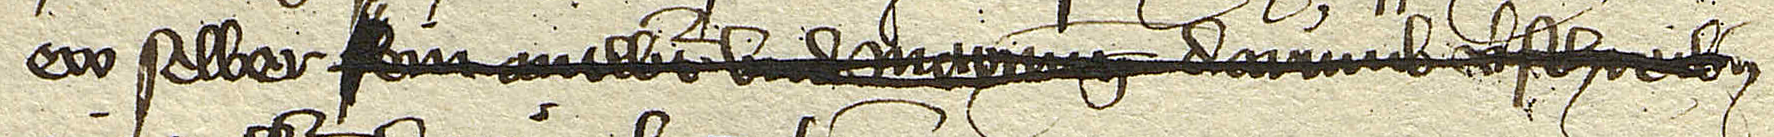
ew ſelber ſein antw*t vnd maynug* darümb v*ſchreibn*
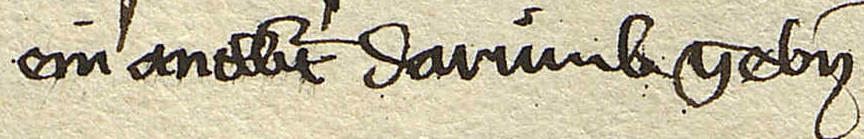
ein antwt* darümb gebn*
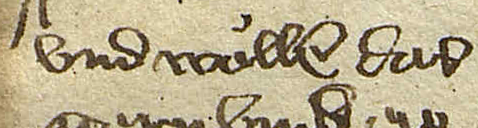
vnd wölle* das
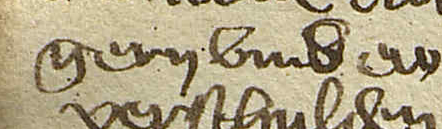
gern vmb ew
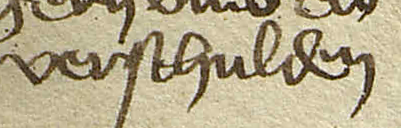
verſchulden
